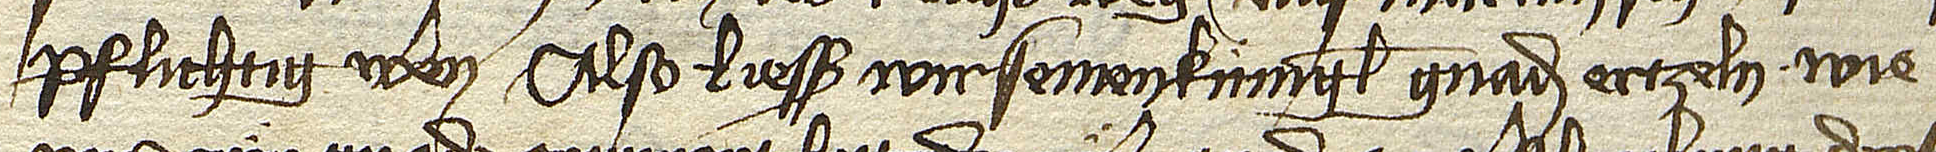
pflichtig wen* / Alſo lieſſ* wir ſeinen künigl* gnad* ercʒeln . wie
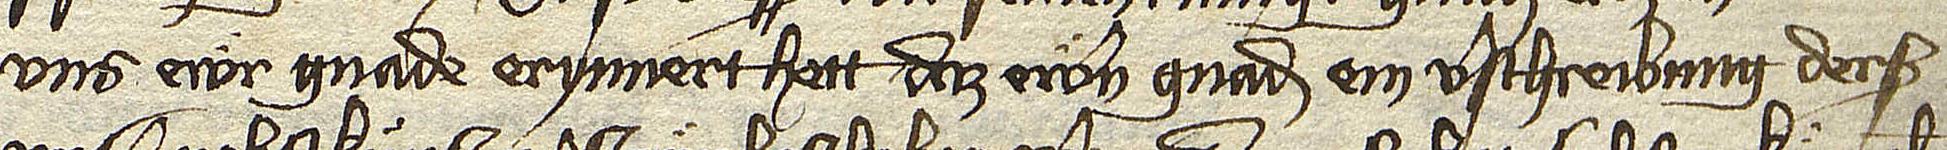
vns ewr gnade erynnert hett / daʒ ew*n gnad* ein v*ſchreibung derſ*
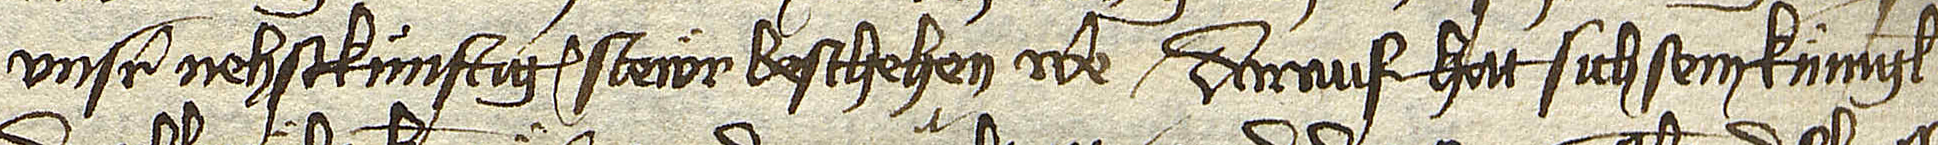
vnſ*r nehſtkünftig* ſtewr beſchehen we* / Darauf hat ſich ſein künigl*
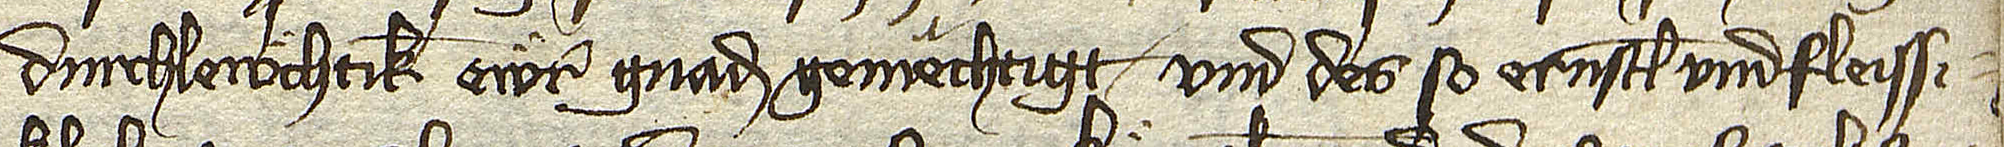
durchlewchtik* ew*r gnad* gemëchtigt / vnd des ſo ernſtl* vnd fleiſſi =
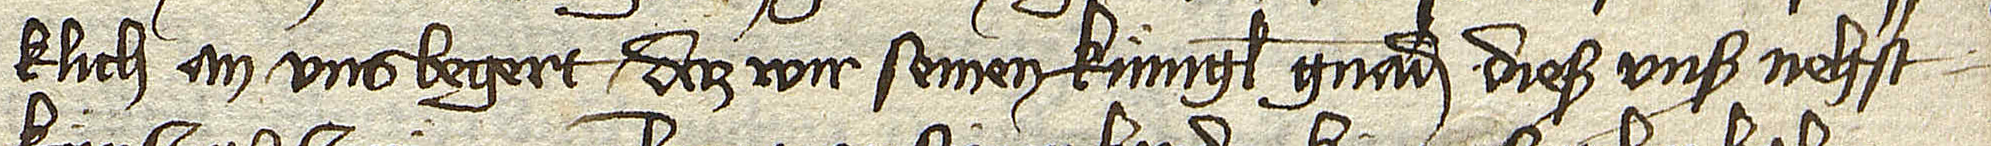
klich an vns begert / daʒ wir ſeinen künigl* gnad* . dieſ* vnſ* nehſt -
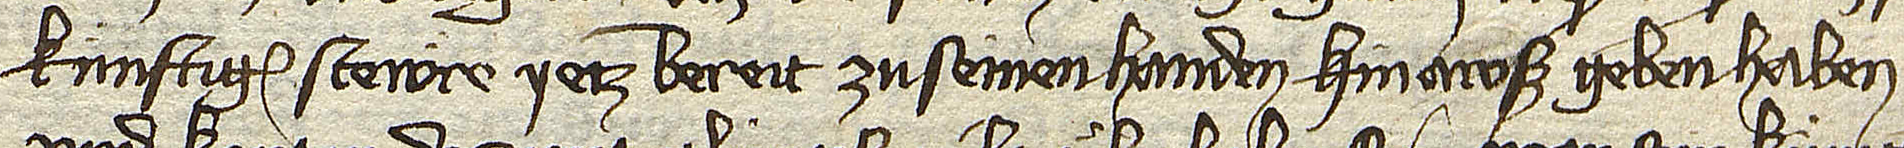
künftig* ſtewre yecʒ* bereit ʒu ſeinen handen hinawſʒ geben haben
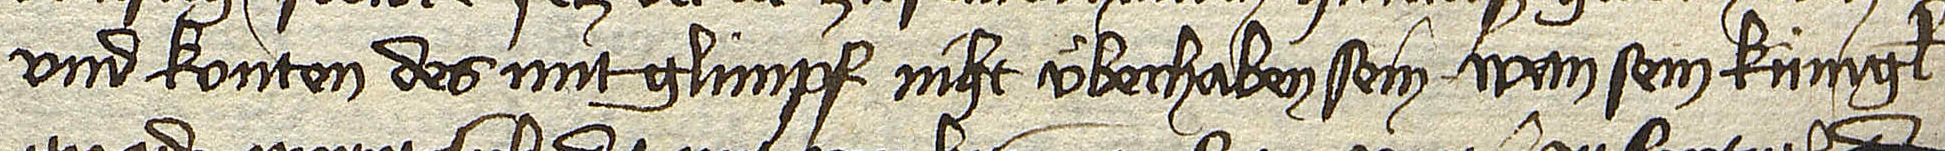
vnd konten des mit glimpf niht v̈berhaben ſein . wan ſein künigl*
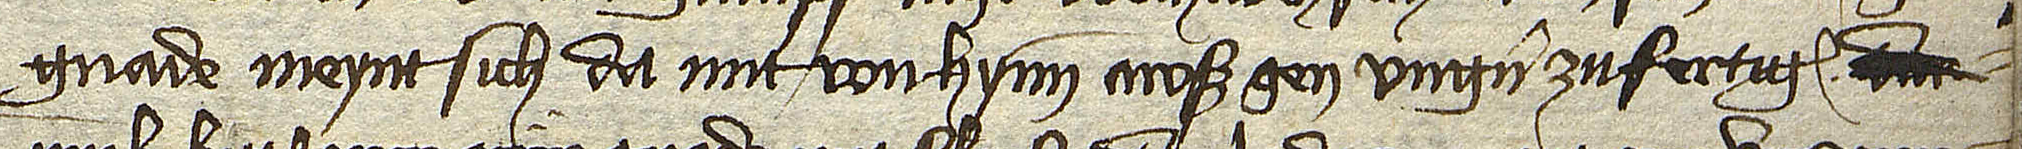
gnade meynt ſich da mit von hynn* awſʒ gen vng*n ʒufertig* dar =
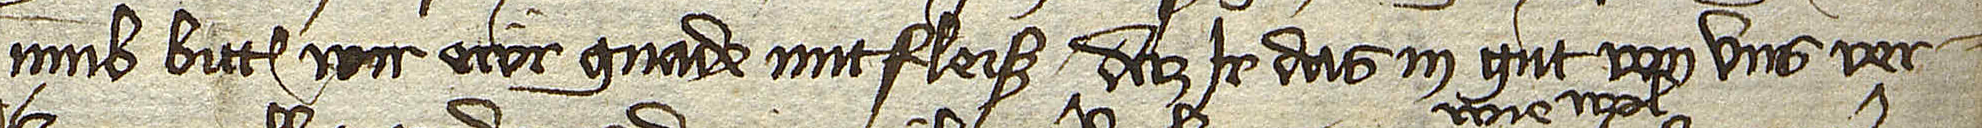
umb bitt* wir ewr gnade mit fleiſʒ / daʒIr das in gut von Vns ver =
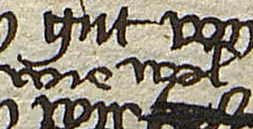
wie wol
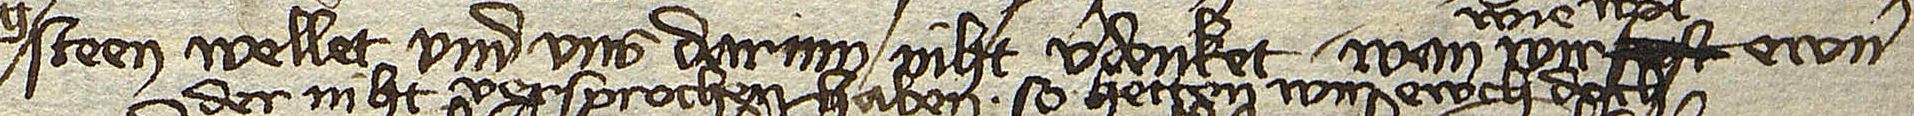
ſteen wellet vnd vns darinn niht v*denket / wan wir ſuſt ew*n
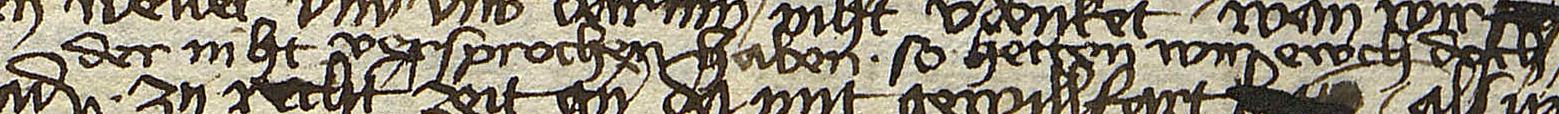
der niht verſprochen haben . ſo hetten wir ewch doch
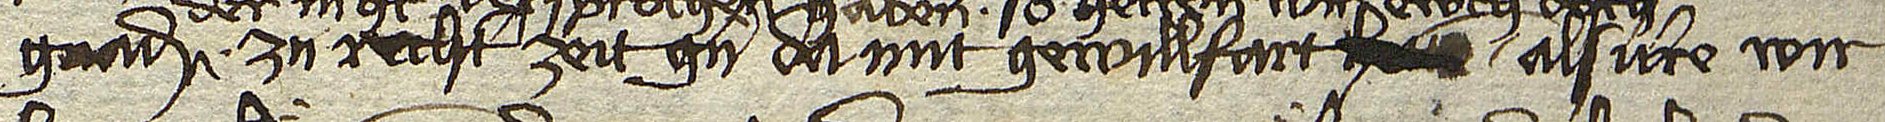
gnad* . ʒu recht* ʒeit g*n da mit gewillfart h%%% / alſu*re wir
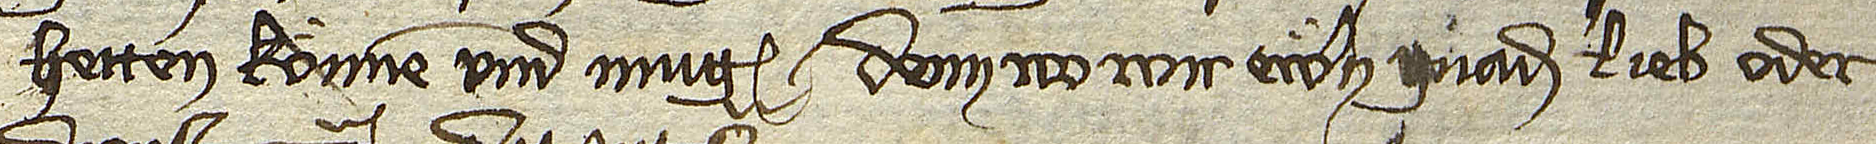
hetten könne* vnd mug* / Denn wo wir ew*n gnad* lieb oder
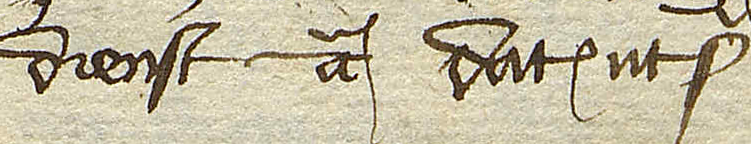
dienſt ec* Dat* ut ſ*
